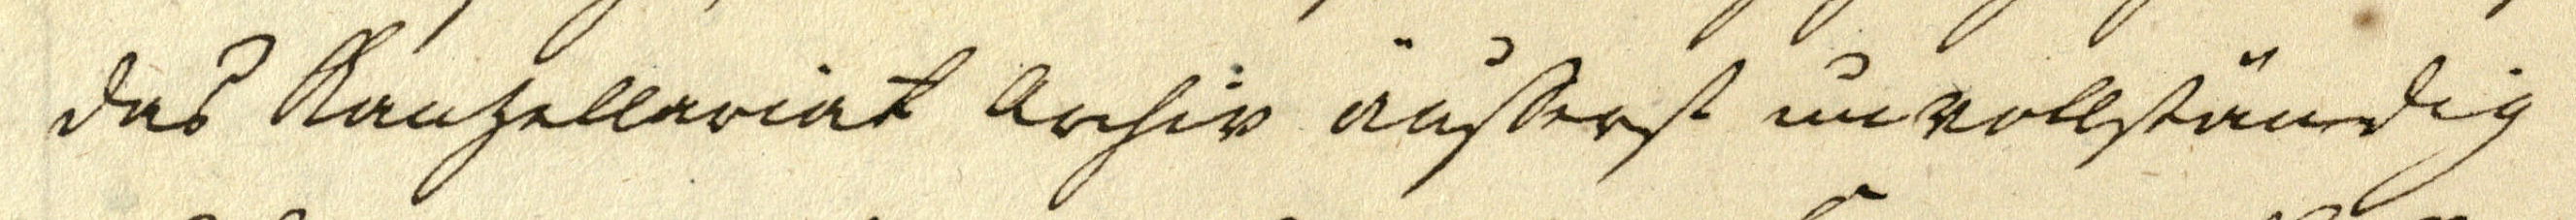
das Kanzellariat Archiv äußerst unvollständig
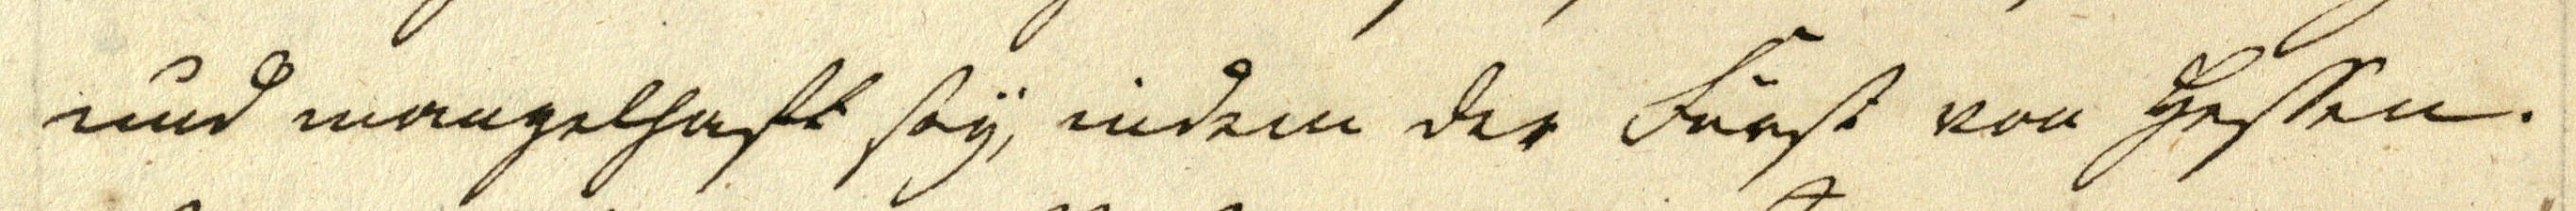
und mangelhaft seÿ, indem der Fürst von Hessen¬
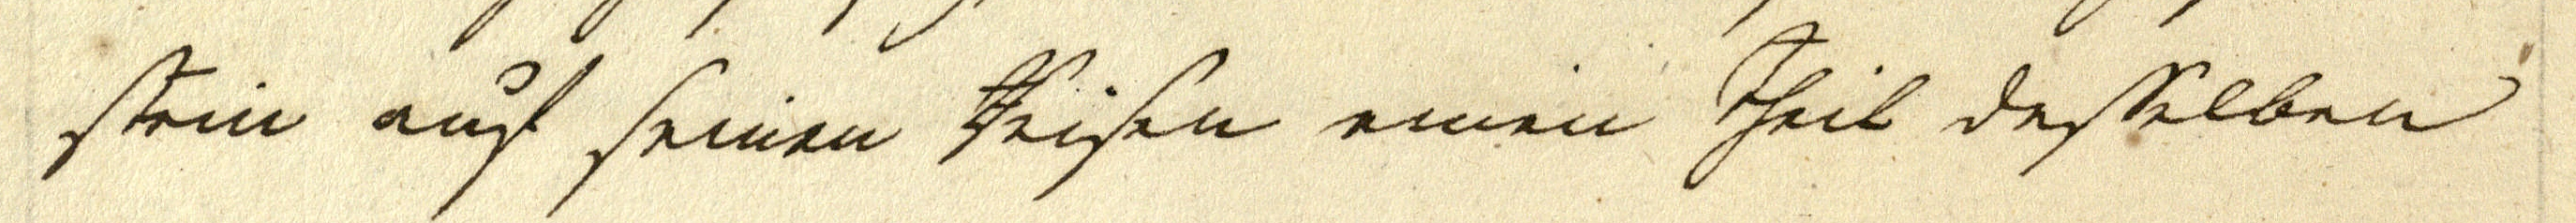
stein auf seinen Reisen einen Theil desselben
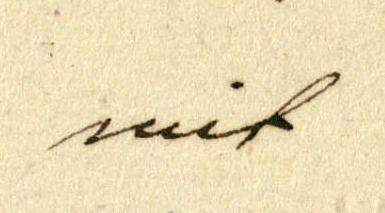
mit
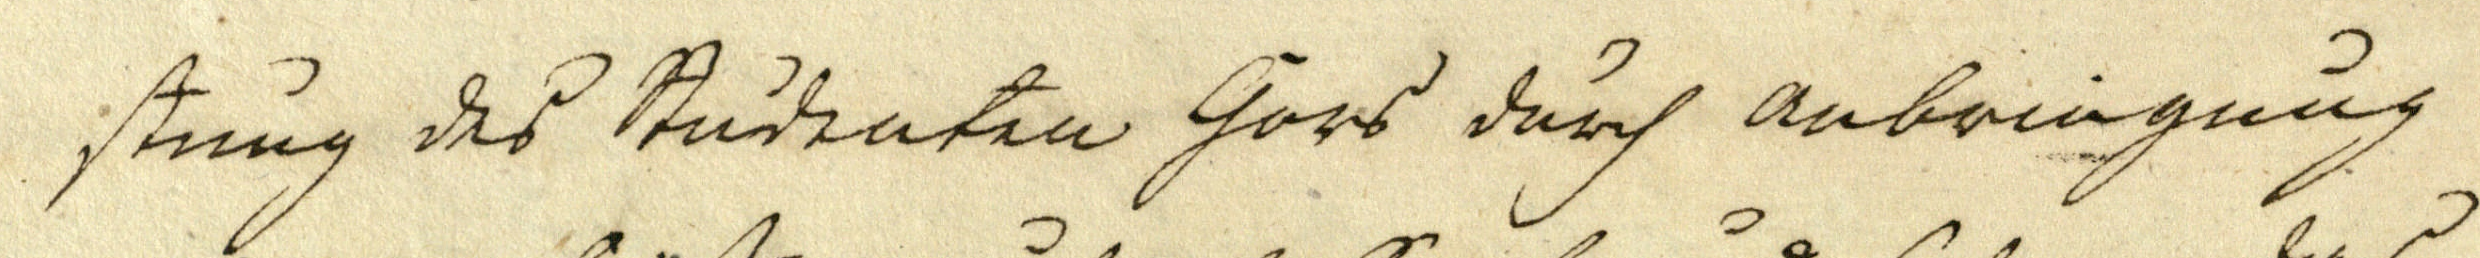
stung des Studenten Chors durch Anbringung
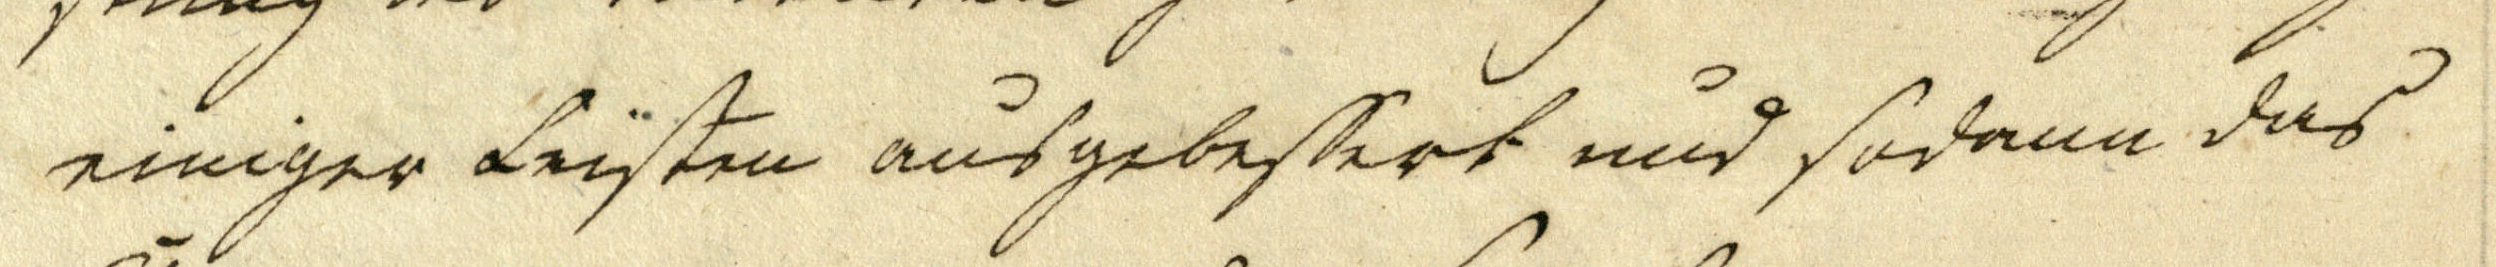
einiger Leisten ausgebessert und sodann das
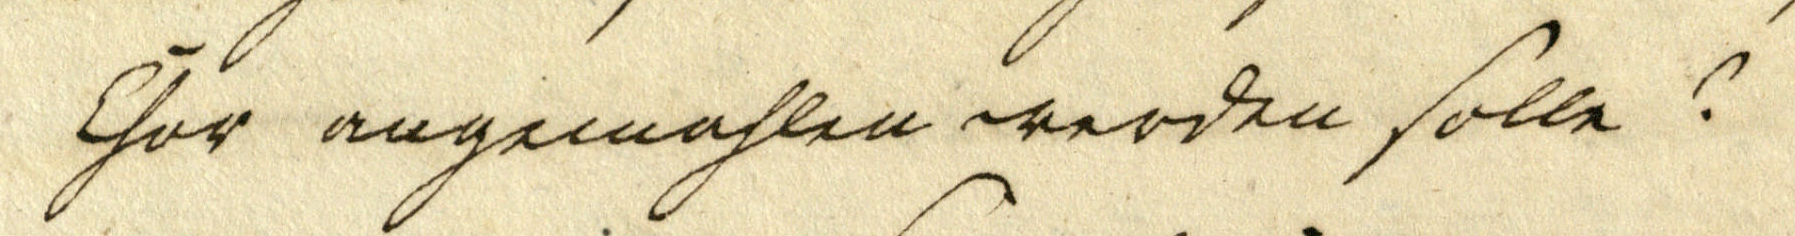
Chor angemahlen werden solle?
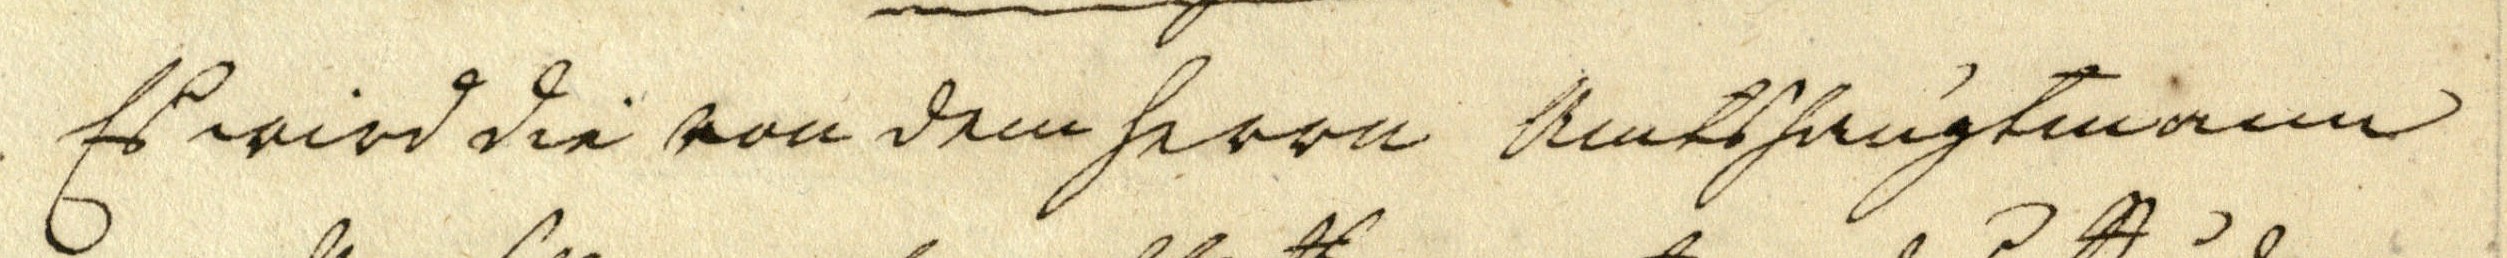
Es wird die von dem herrn Amtshauptmann
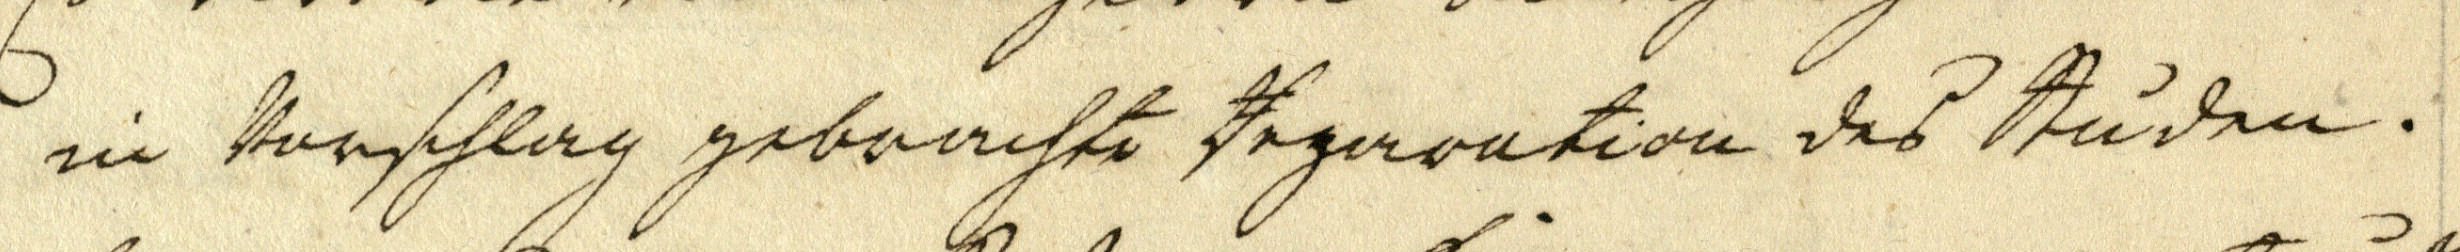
in Vorschlag gebrachte Reparation des Student¬
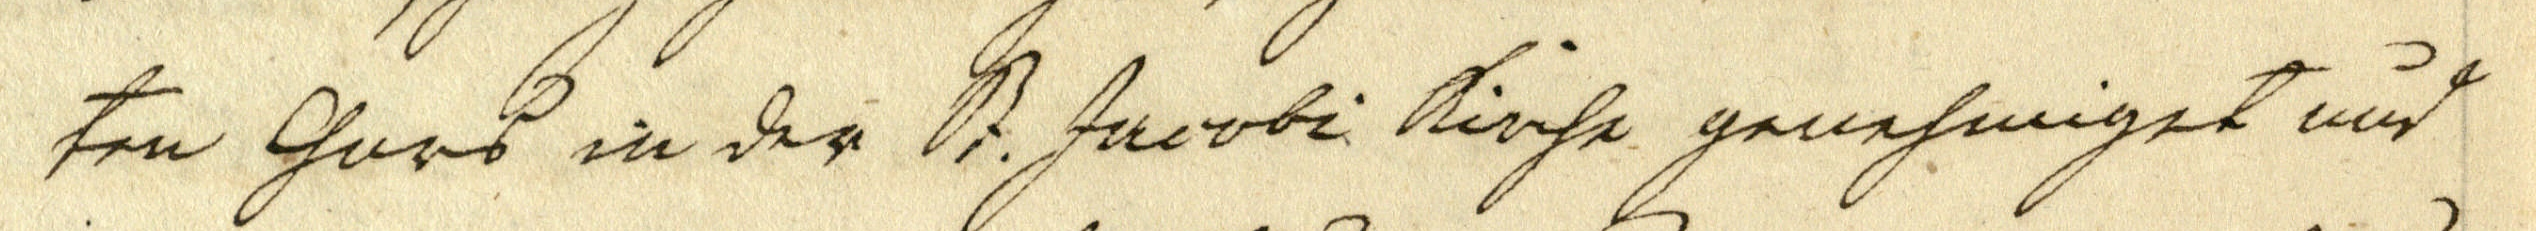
ten Chors in der St. Jacobi Kirche genehmiget und
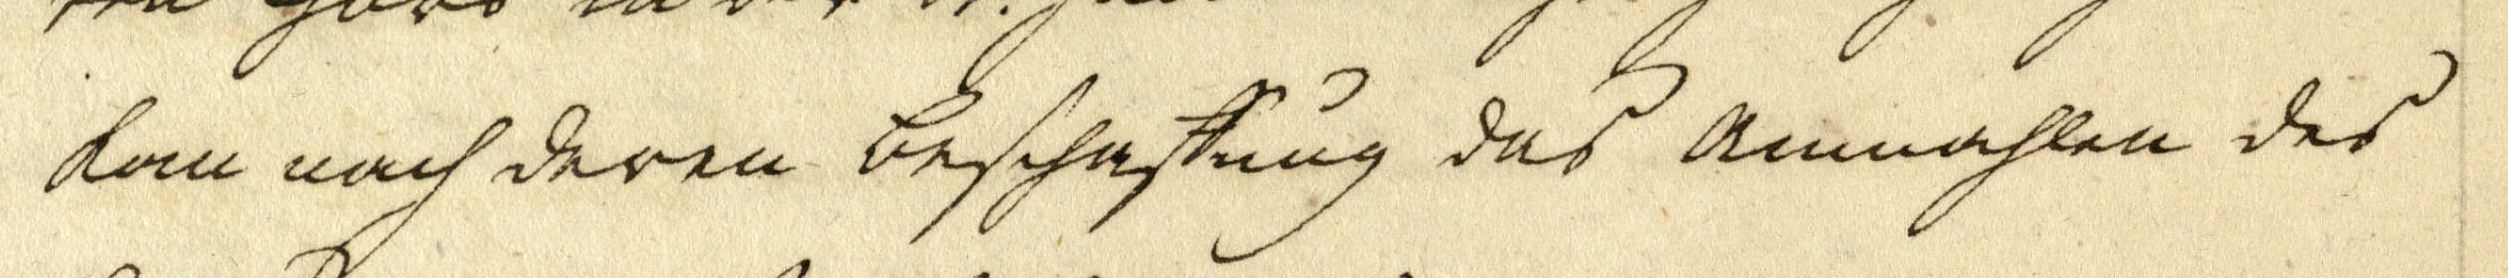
kan nach deren Beschaffung das Anmahlen des
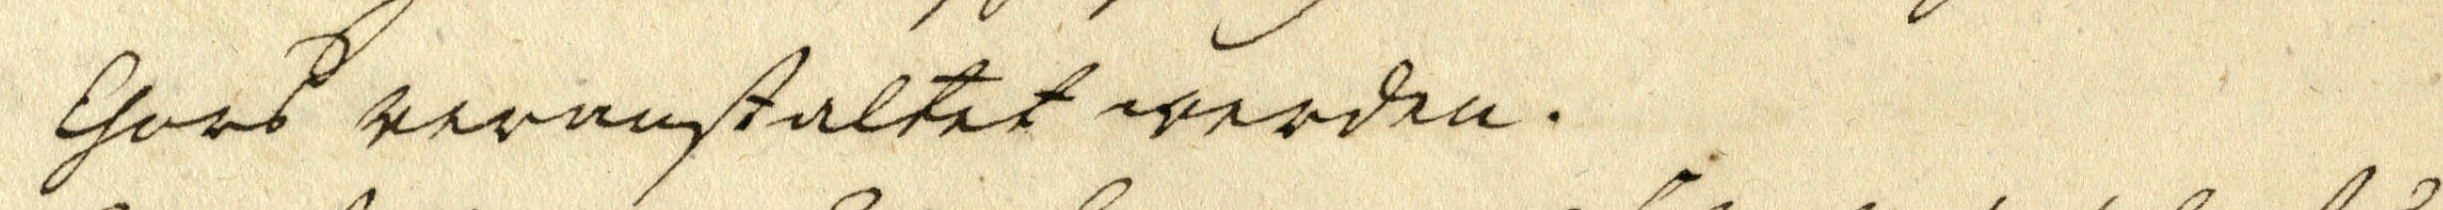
Chors veranstaltet werden.
